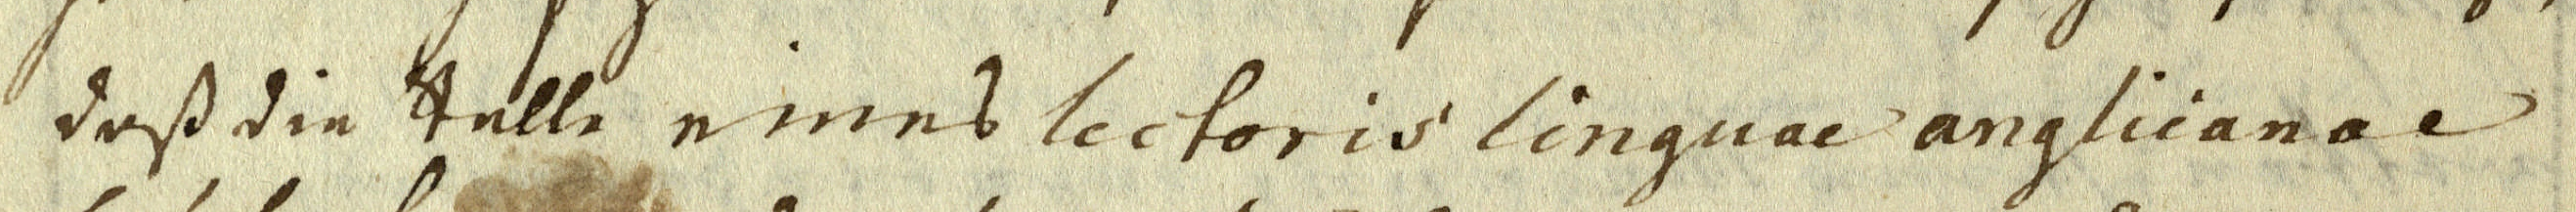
daß die Stelle eines lectoris linguae anglicanae
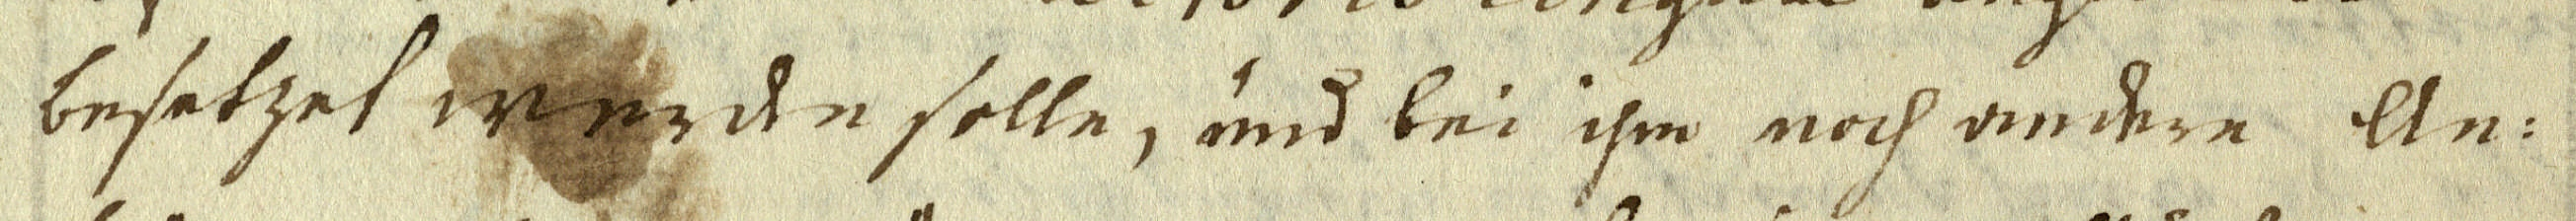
besetzet werden solle, und bei ihm noch andere An¬
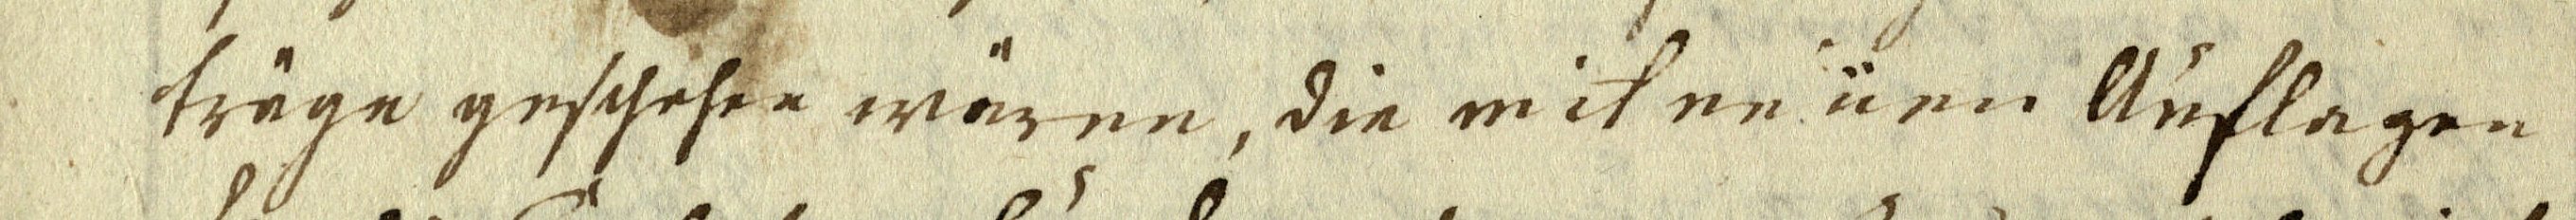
träge geschehen wären, die mit neuen Auflagen
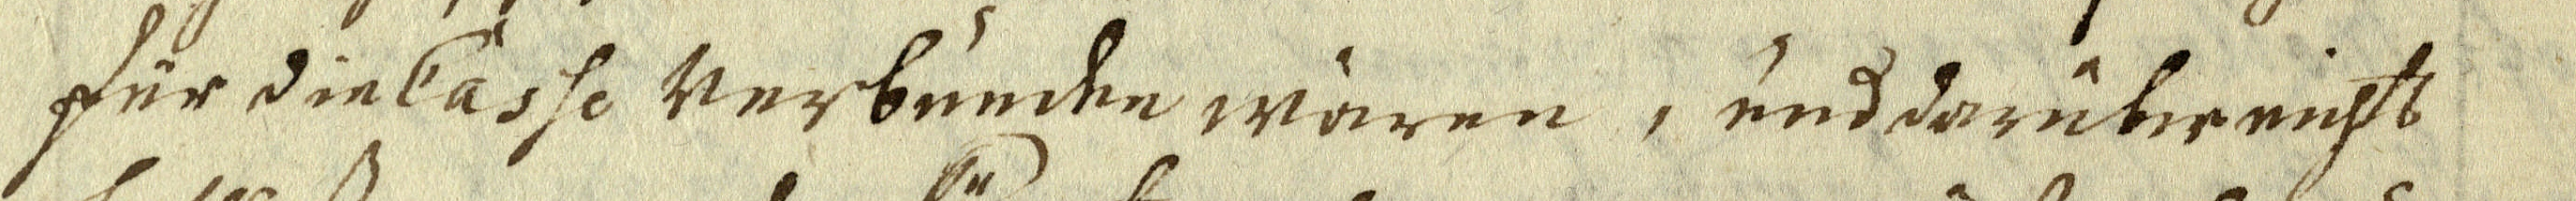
für die Casse verbunden wären, und darüber nichts
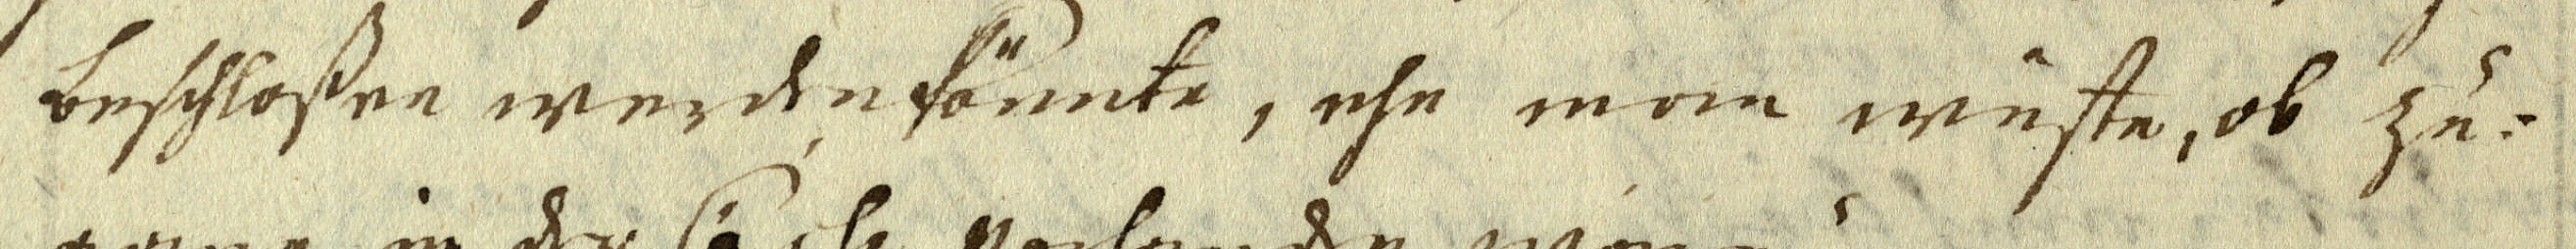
beschloßen werden könnte, ehe man wüste, ob Zu¬
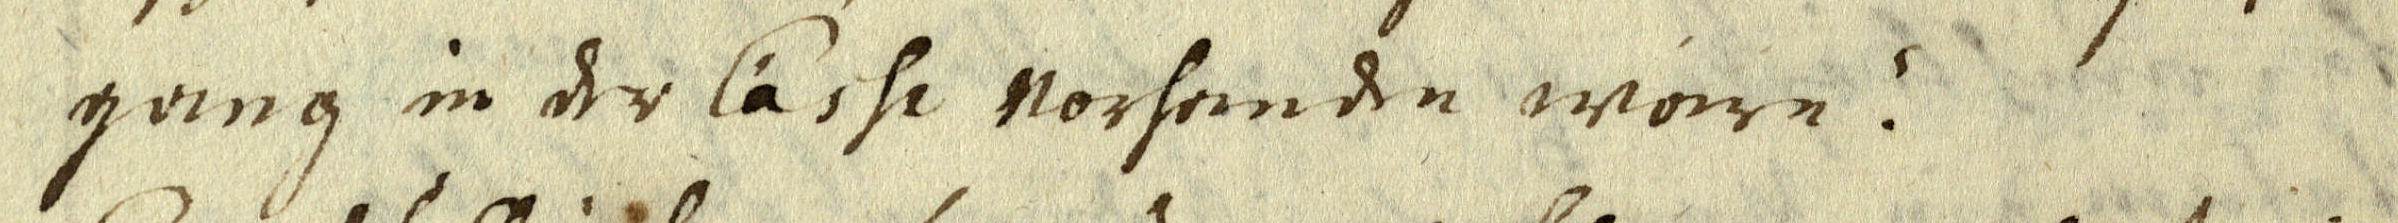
gang in der Casse vorhanden wäre?
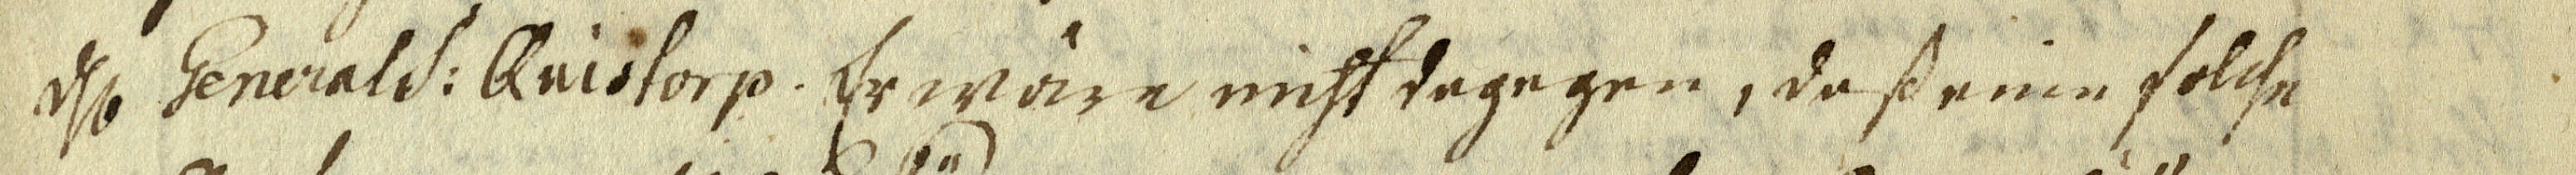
dh GeneralS. Quistorp. Er wäre nicht dagegen, daß eine solche
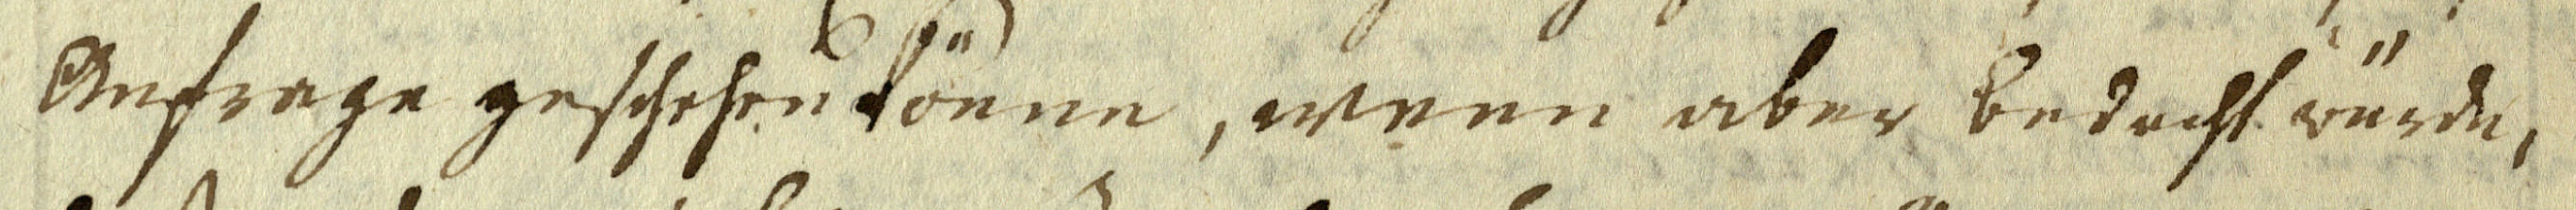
Anfrage geschehen könne, wenn aber bedacht würde,
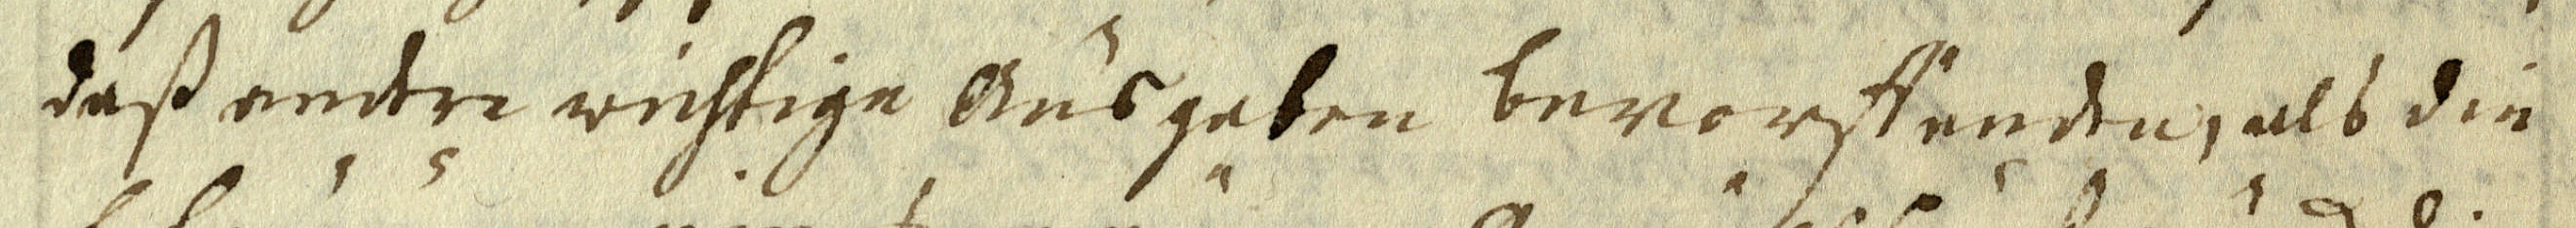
daß andere wichtige Ausgaben bevorstünden, als die
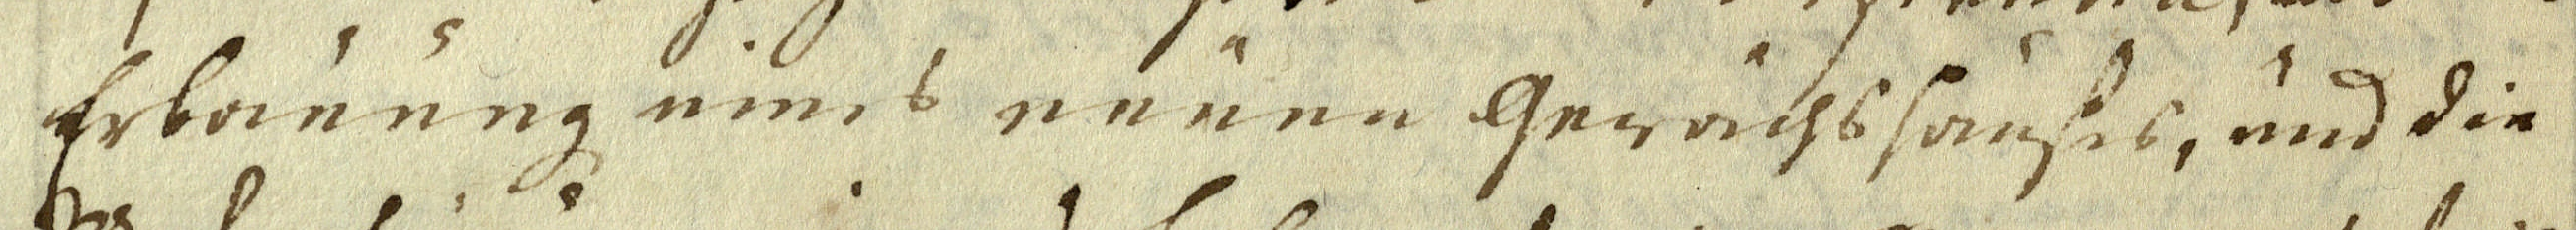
Erbauung eines neuen Gewächshauses, und die
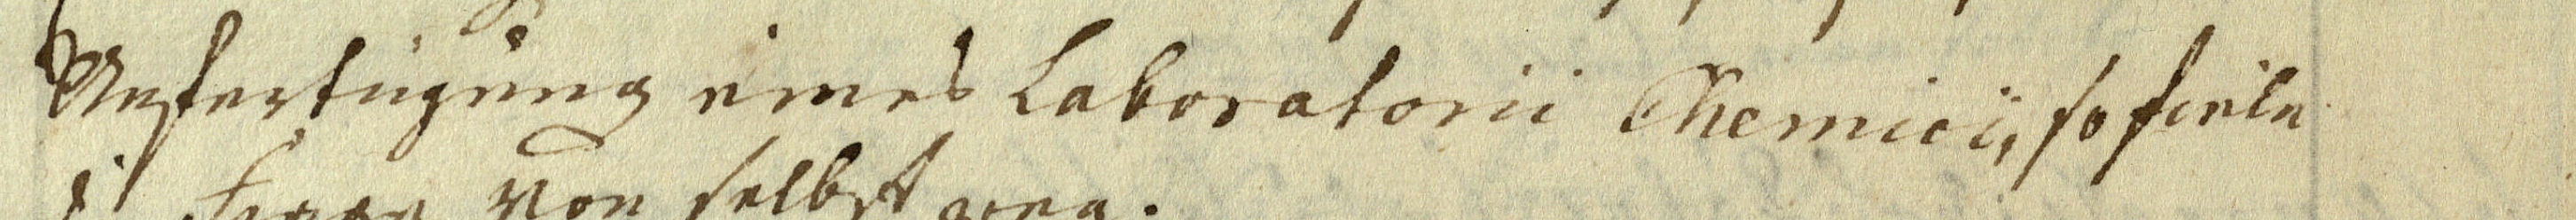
Anfertigung eines Laboratorii Chemici, so fiele
